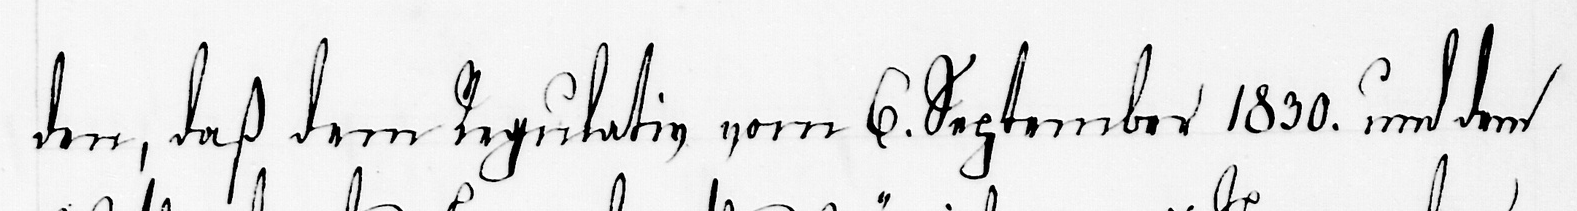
den, daß dem Regulativ vom 6. September 1830. und dem
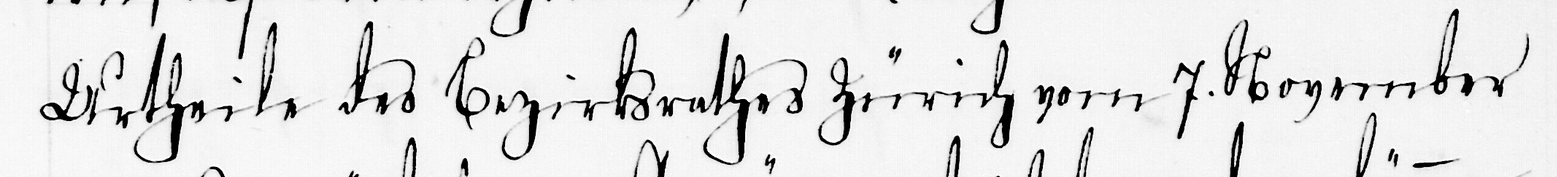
Urtheile des Bezirksrathes Zürich vom 7. November
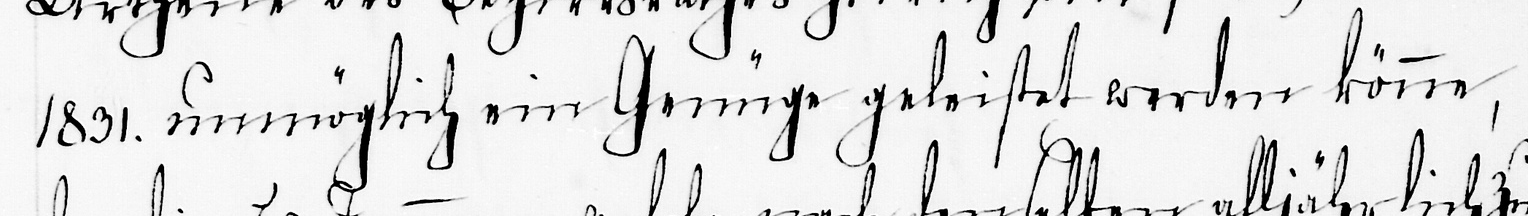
1831. unmöglich ein Genüge geleistet werden könne,
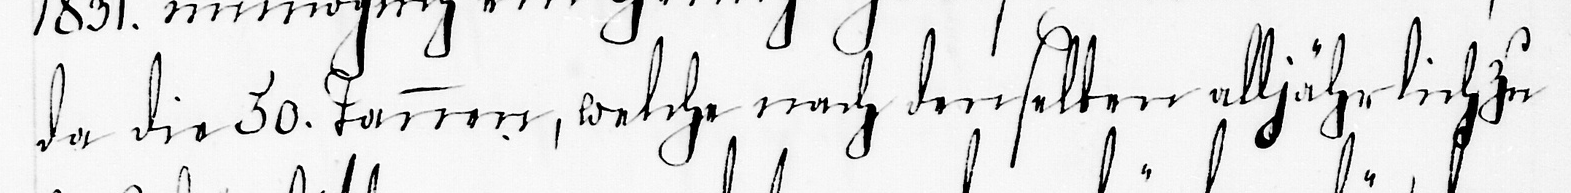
da die 50. Tannen, welche nach denselben alljährlich zu
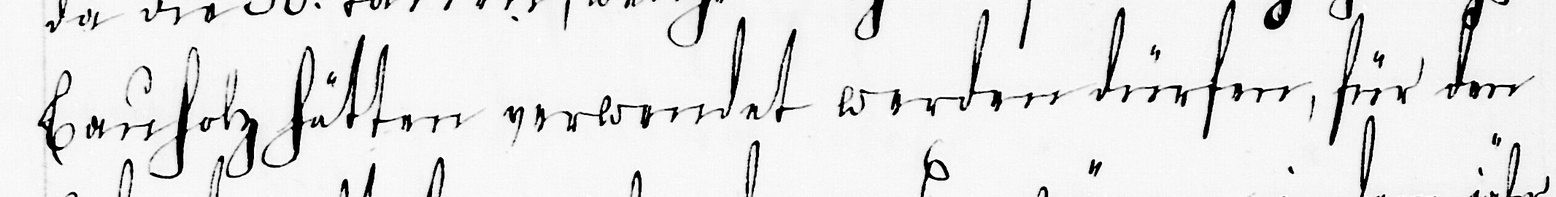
Bauholz hätten verwendet werden dürfen, für den
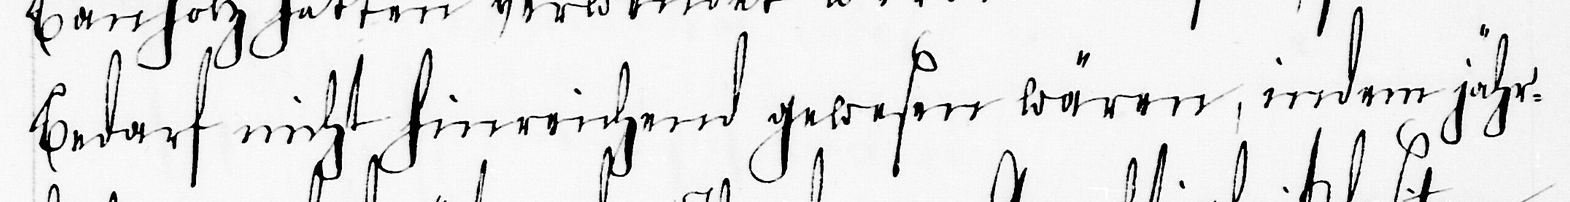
Bedarf nicht hinreichend gewesen wären, indem jähr¬
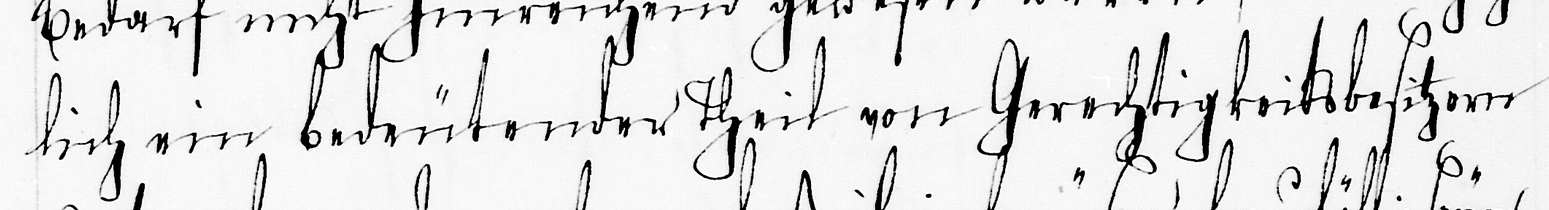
lich ein bedeutender Theil von Gerechtigkeitsbesitzern
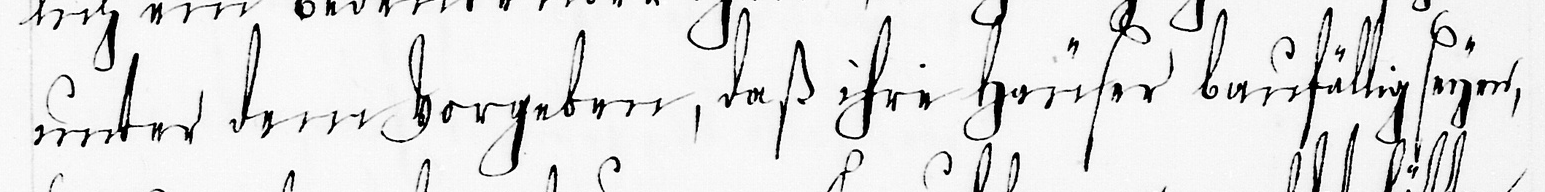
unter dem Vorgeben, daß ihre Häuser baufällig seyen,
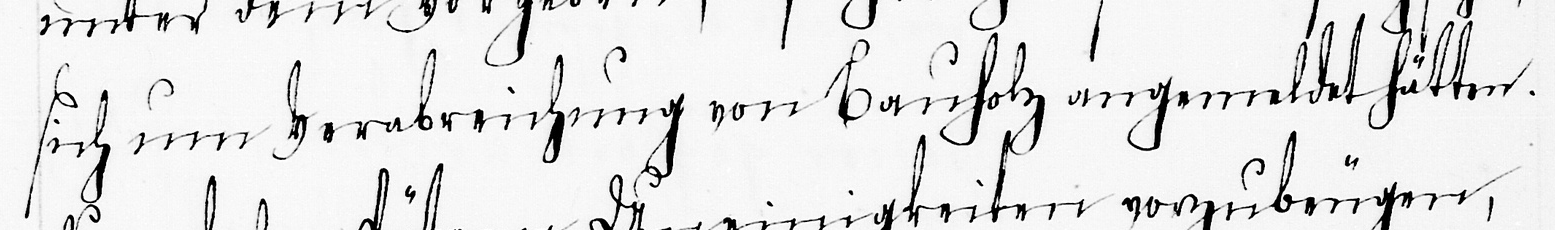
sich um Verabreichung von Bauholz angemeldet hätten.
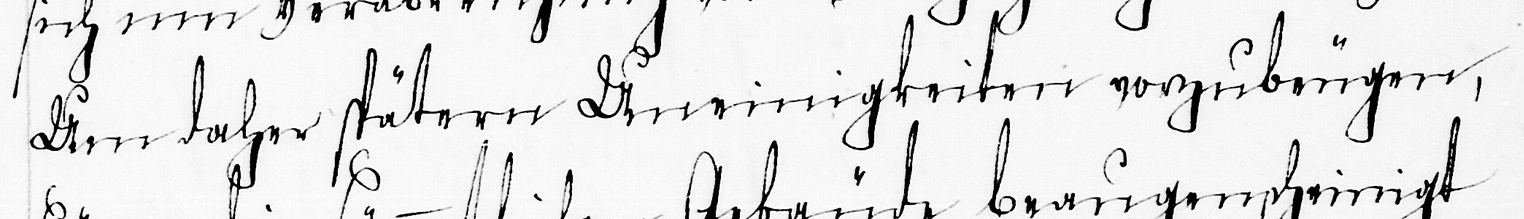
Um daher spätern Uneinigkeiten vorzubeugen,
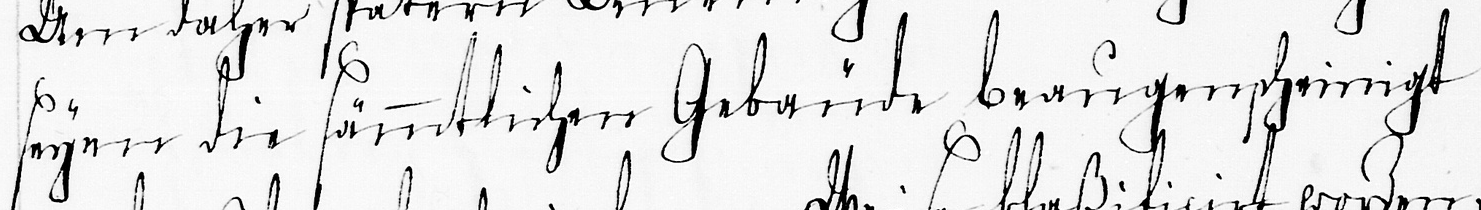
seyen die sämmtlichen Gebäude beaugenscheinigt
